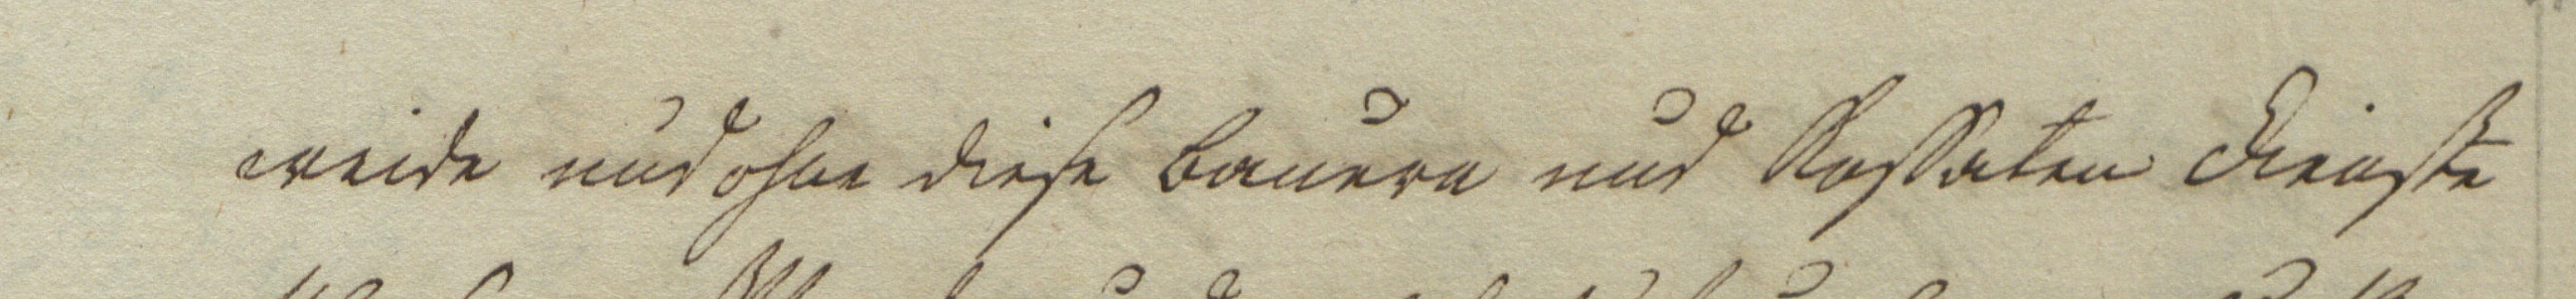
weide und ohne diese Bauern und Kossaten Dienste
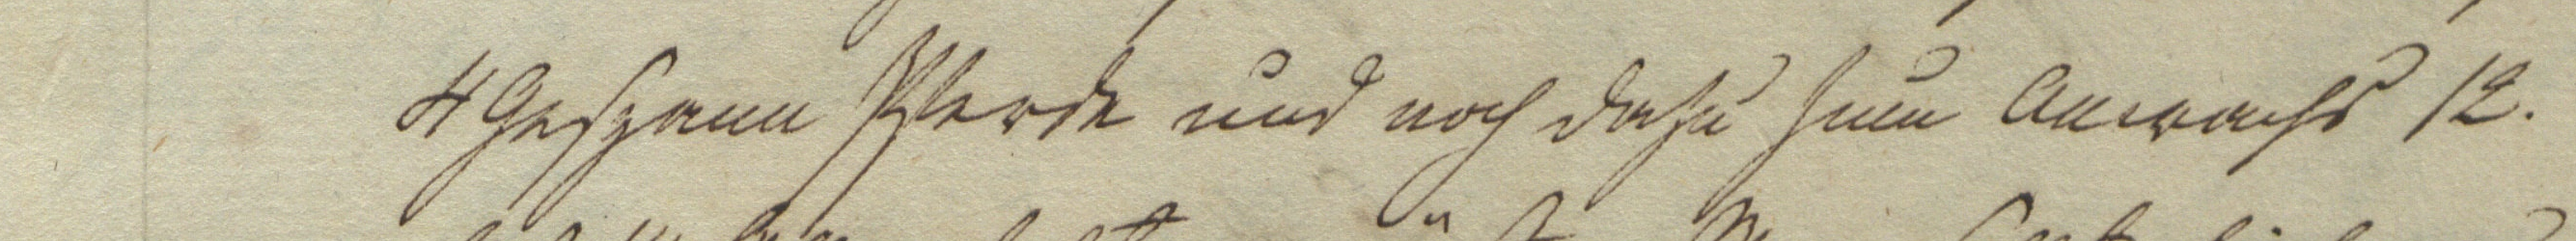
4 Gespann Pferde und noch dazu zum Anwachs 12
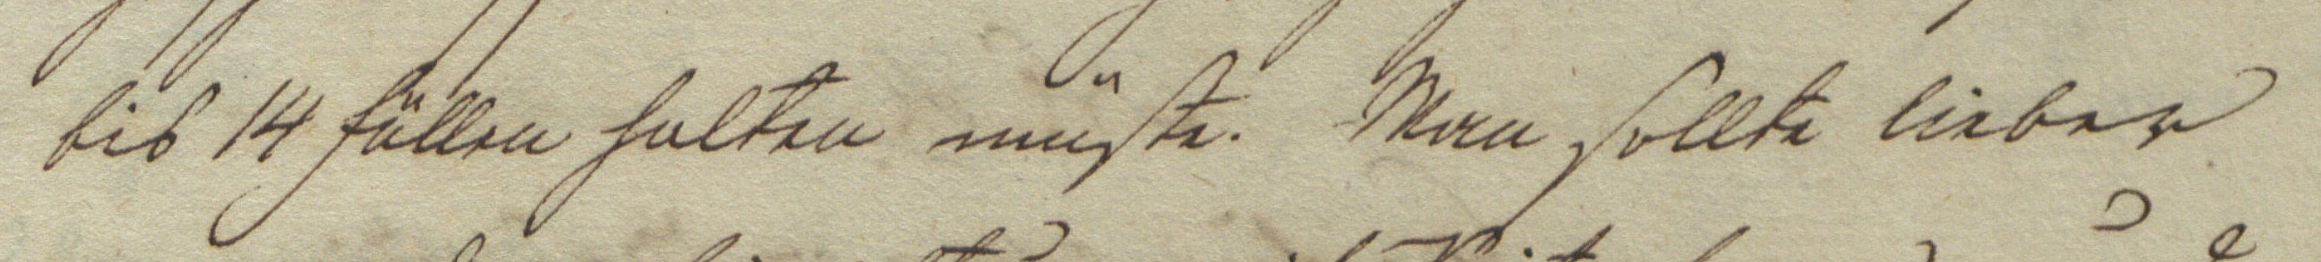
bis 14 Füllen halten müßte. Man sollte lieber
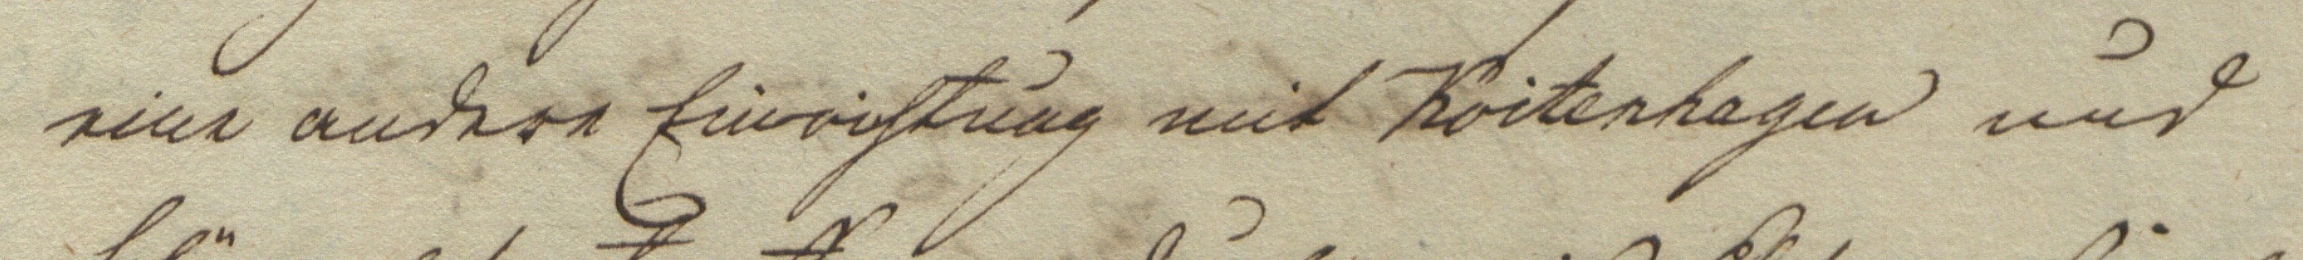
eine andere Einrichtung mit Koitenhagen und
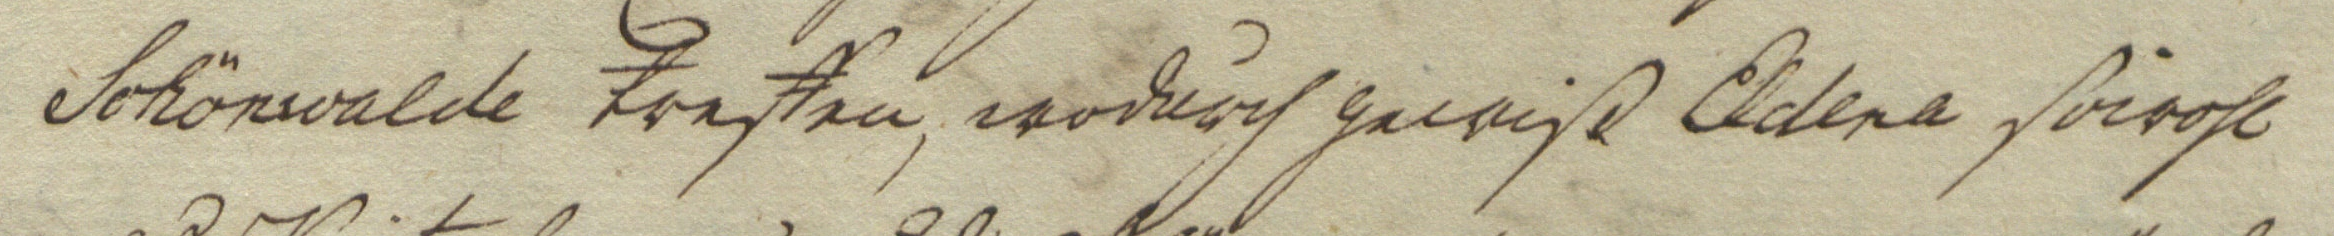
Schönwalde treffen, wodurch gewiß Eldena sowohl
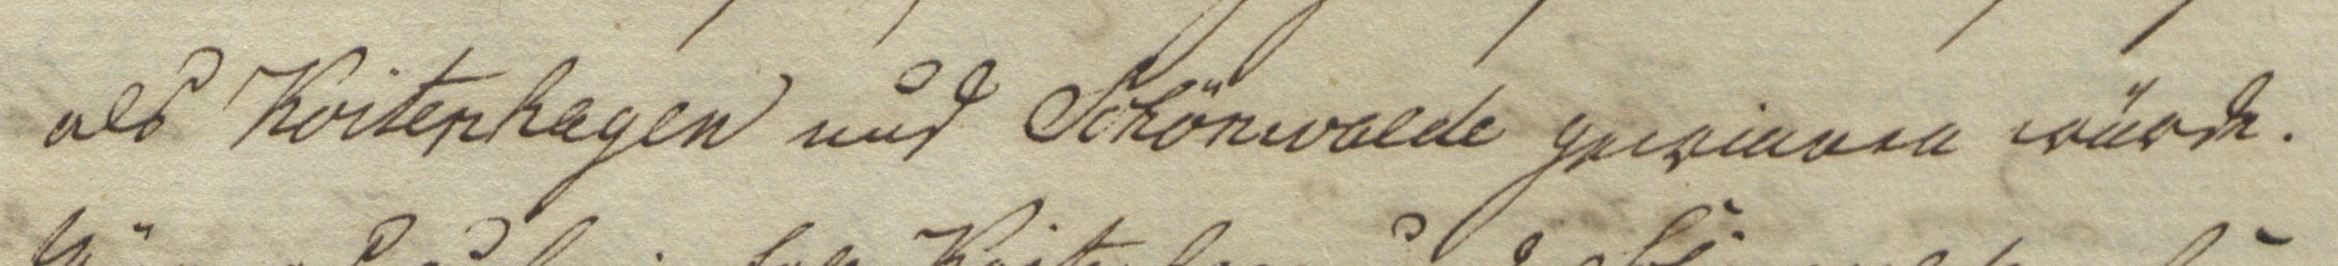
als Koitenhagen und Schönwalde gewinnen würde.
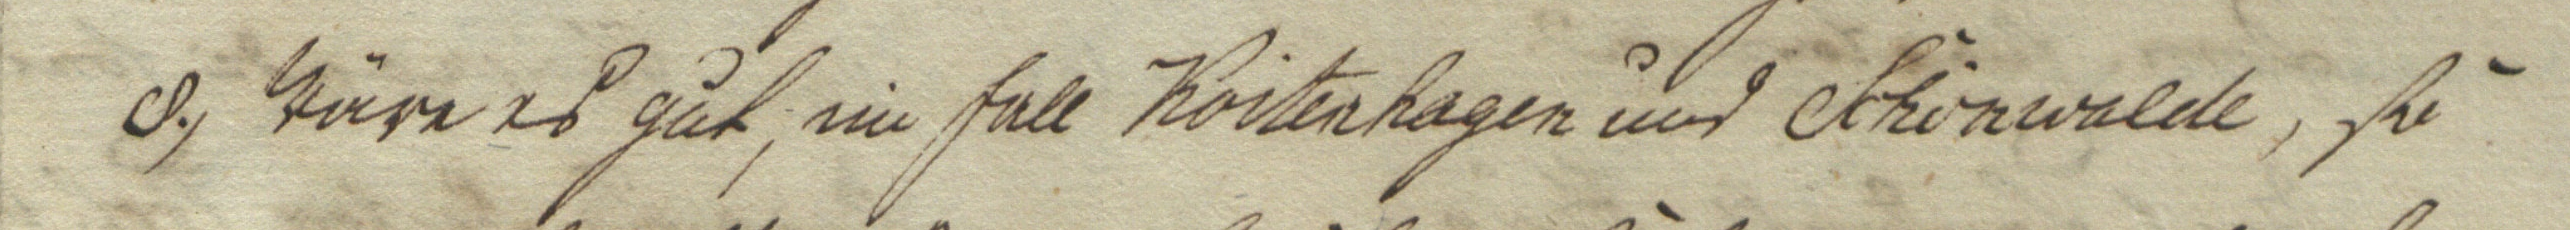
8., Wäre gut im Fall Koitenhagen und Schönwalde, so
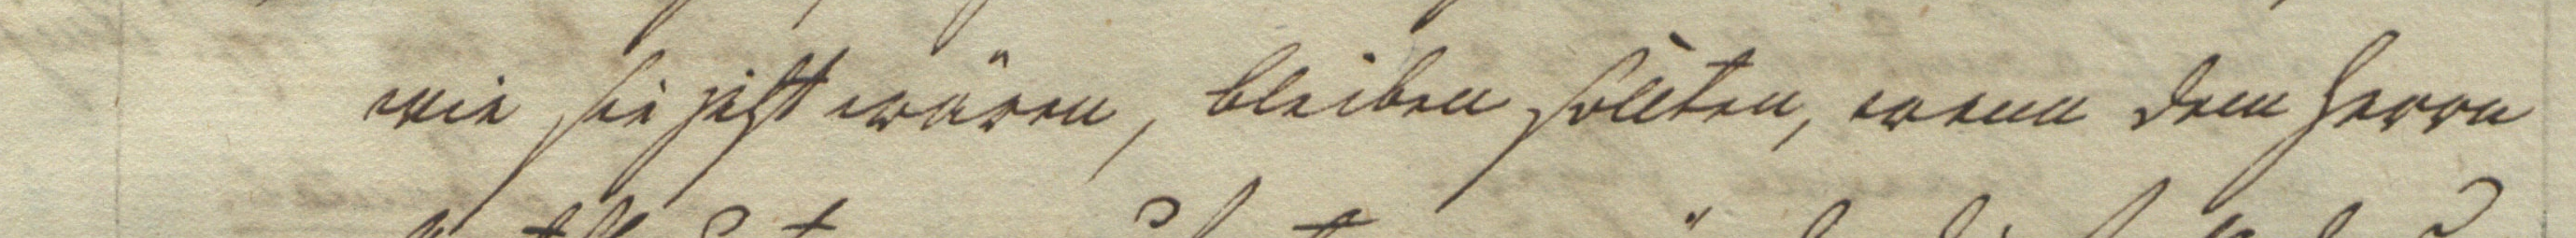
wie sie jetzt wären, blieben sollten, wenn dem Herrn
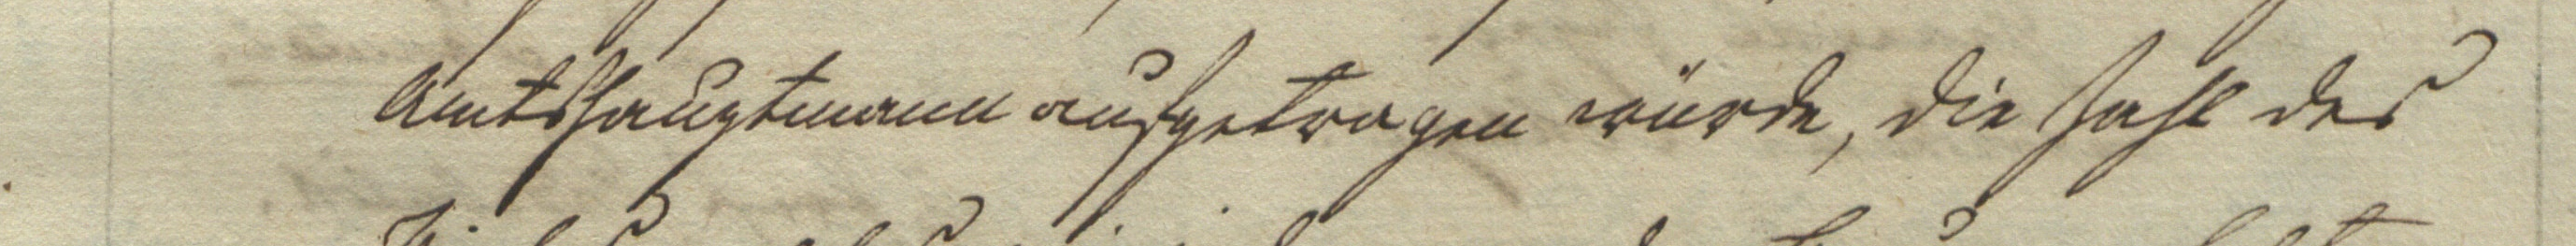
Amtshauptmann aufgetragen würde, die Zahl des
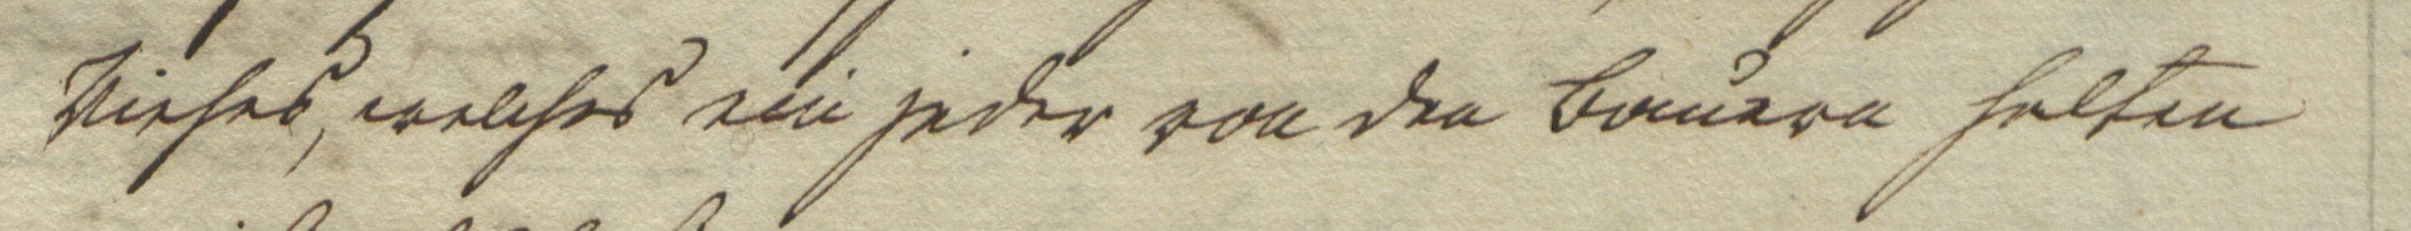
Viehes, welches wie jeder von den Bauern halten
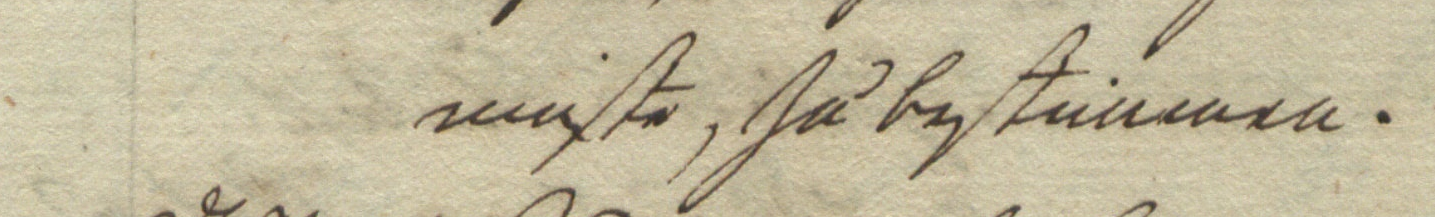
müßte, zu bestimmen.
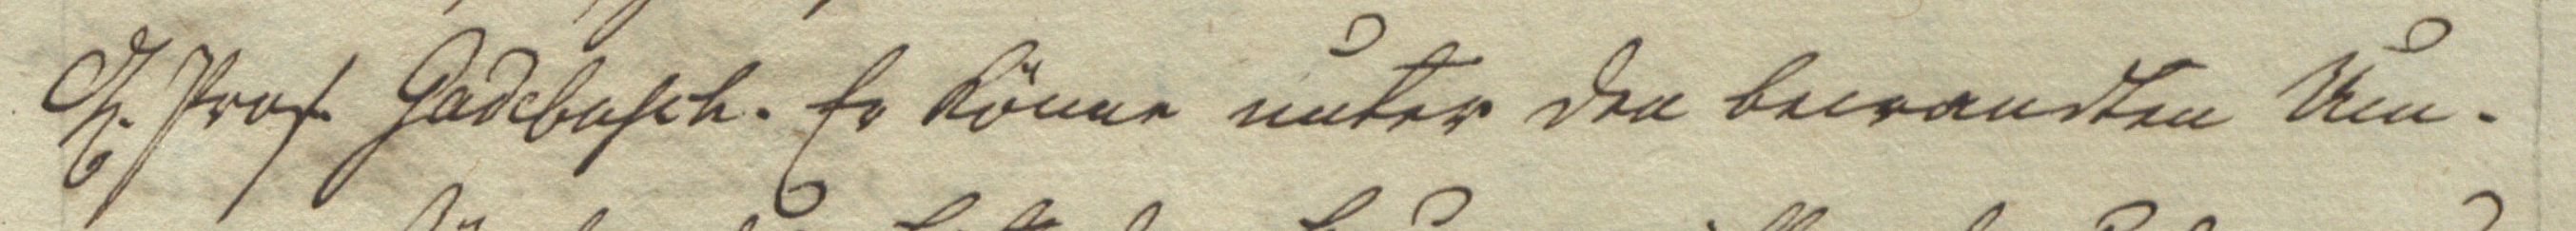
dh. Prof. Gadebusch. Er könne unter den bewandten Um¬
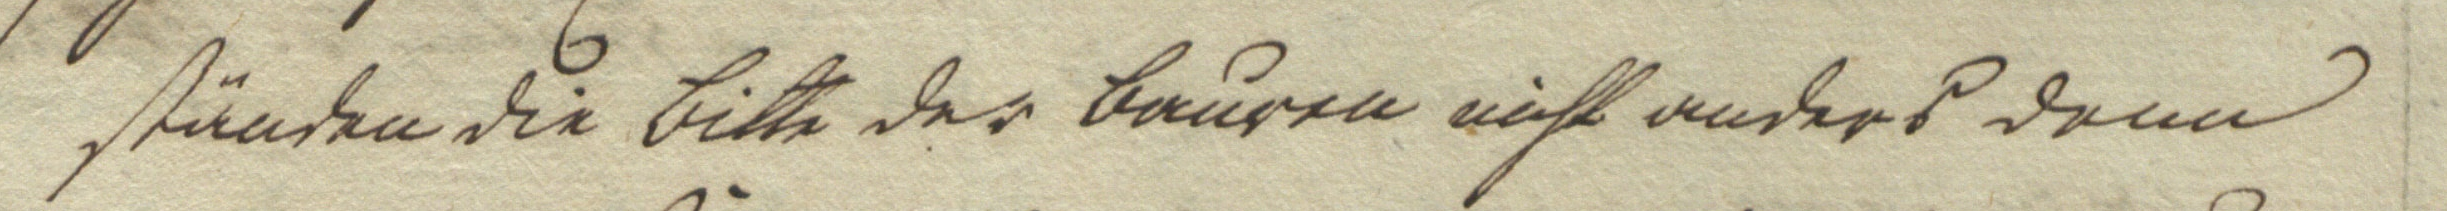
ständen die Bitte der Bauren nicht anders denn
